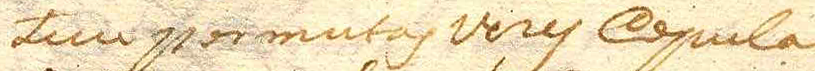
teue por mutas vezes copula
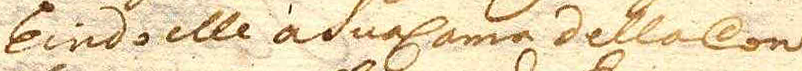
hindo elle a Sua Cama della con
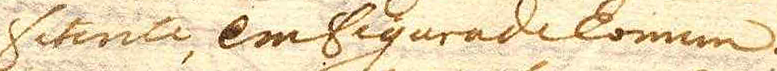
fitente, em figura de homem;
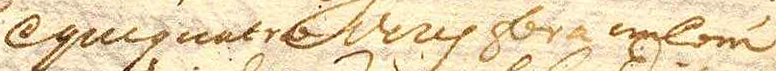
e que quatro vezes fora em com
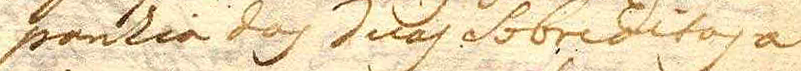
panhia das duas Sobreditas a
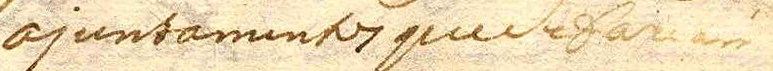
ajuntamentos que Se faziam
